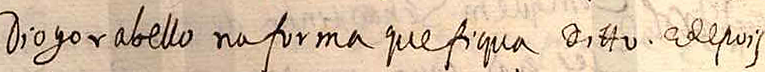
Diogo rabello na forma que fiqua ditto. E depois
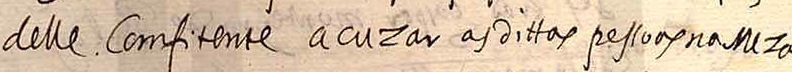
delle Confitente acuzar as dittas pessoas na Meza
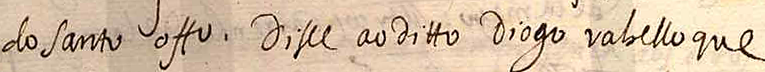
do Santo offo. Disse ao ditto diogo rabello que
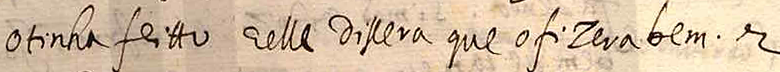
o tinha feitto E elle dissera que o fizera bem. E
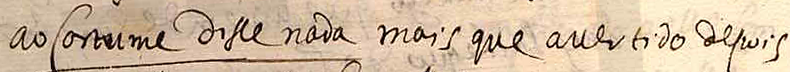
ao Costume disse nada mais que auer tido depois
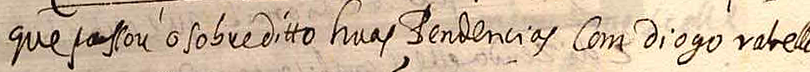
que passou o sobreditto huas Pendencias Com diogo rabello
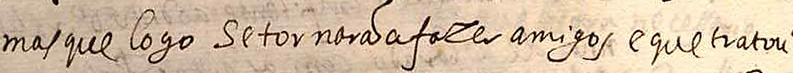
mas que logo Se tornaraõ a fazer amigos e que tratoū
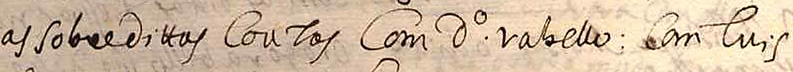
as sobredittas Couzas Com D.o rabello: Com luis
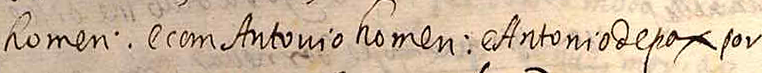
homen: e com Antonio homen: Antonio de pax por
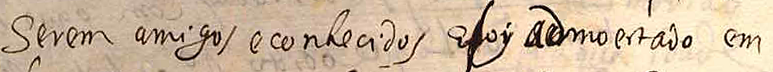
Serem amigos e conhecidos E foy admoestado em
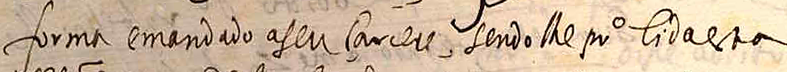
forma e mandado a seu Carcere, sendo lhe pro lida esta
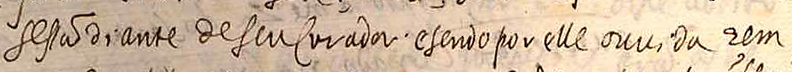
sessaõ diante de seu Curador. e sendo por elle ouuida E em
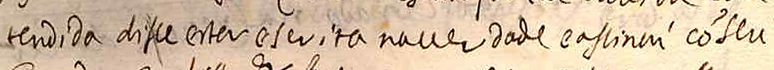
tendida disse estar escrita na uerdade e assinoū cō seu
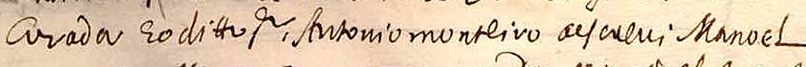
Curador E o ditto sor. Antonio monteiro o escreui ManoeL
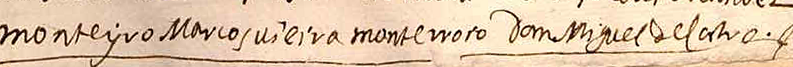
monteyro Marcos uieira monterroto Dom Miguel de Castro.
